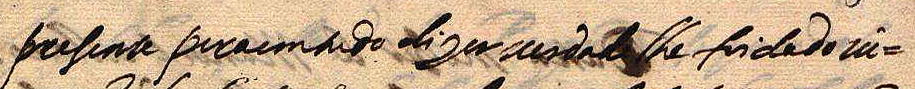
presente pera em tudo dizer uerdade lhe foi dado iu
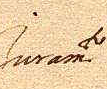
Iuram.to
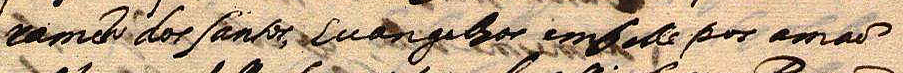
ramēto dos santos Euangelhos em q̄ elle pos a maõ
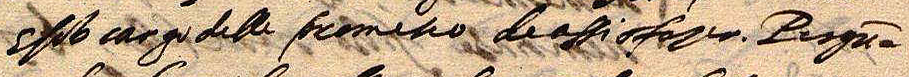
E sob cargo delle prometeo de assi o fazer. Pergū
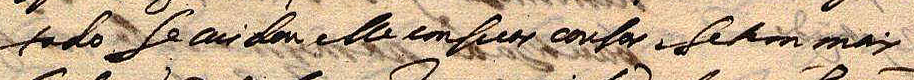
tado se cuidou elle em suas cousas, e se tem mais
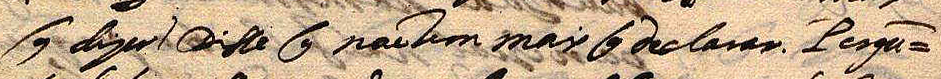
q̄ dizer / Disse q̄ naõ tem mais q̄ declarar. Pergū
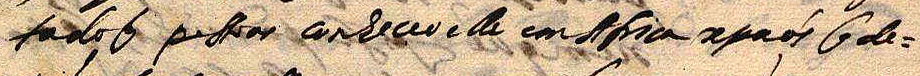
tado q̄ pessoas conheceo elle em Africa xpaõs q̄ de
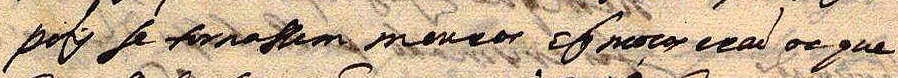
pois se tornassem mouros E q̄ moços eraõ os que
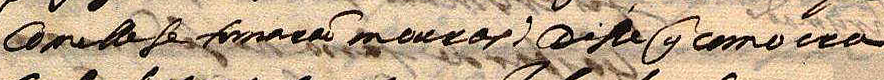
com elle se tornaraõ mouros / Disse q̄ como era
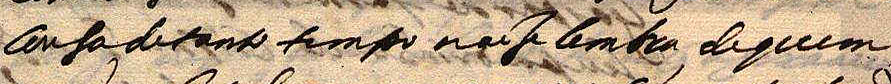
cousa de tanto tempo naõ se lembra de quem
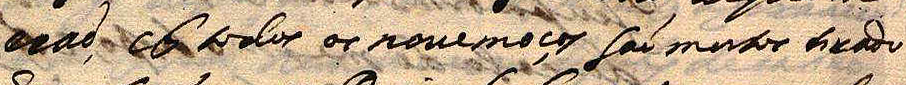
eraõ, e q̄ todos os noue moços saõ mortos tirado
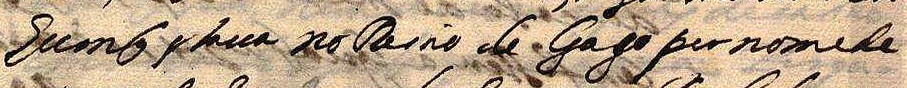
Hum q̄ estaua no Reino de Gago por nome de
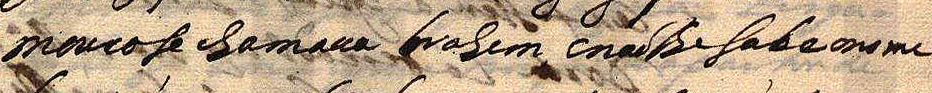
mouro se chamaua brahem, e naõ lhe sabe o nome
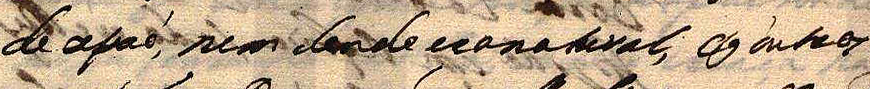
de xpaõ, nem donde era natural, e q̄ outros
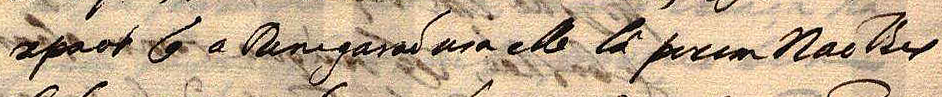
xpaõs q̄ aRenegaraõ uia elle lá porem naõ lhes
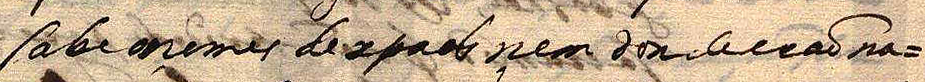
sabe o nomes de xpaõs nem donde eraõ na
